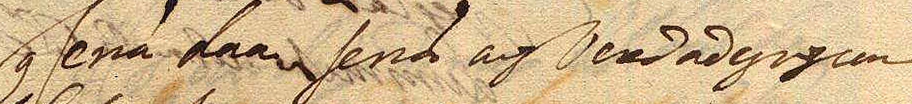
q̄ se nā daa senaõ aos verdadejros con
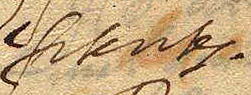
fitentes.
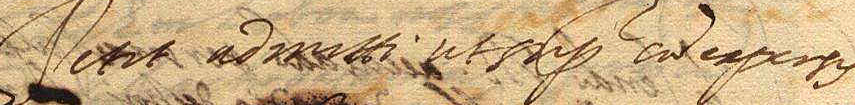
Petit admitti ut sup̄ cū expensis.
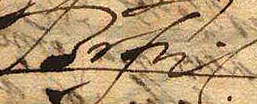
Br frz̄
